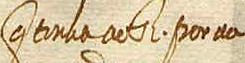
q̄ tinha ao R. por ua
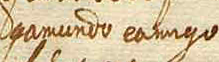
gamundo e amigo
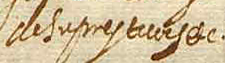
de supresteções &c.
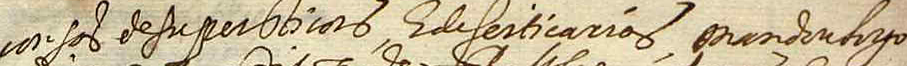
cousas de superstiçois, E de feitiçarias, mandou logo
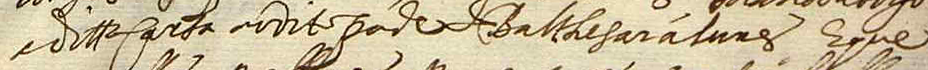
a ditta Carta ao dito pade Balthesar alures E que
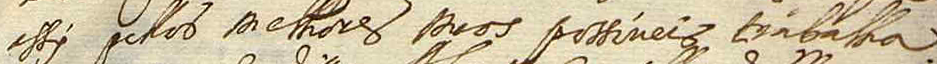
assy pellos melhores meos possiueis trabalha
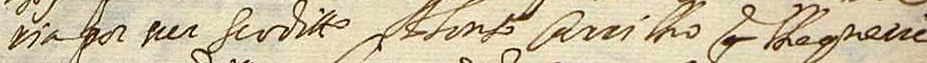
ria por uer se o ditto Alonso Carrilho q̄ lhe queria
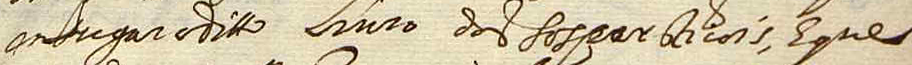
entregar o ditto Liuro das sospertiçois, E que
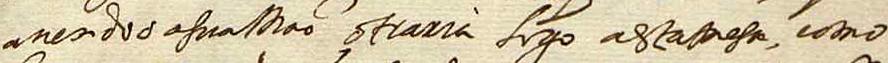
auendoo a sua maõ o traria logo a esta mesa, como
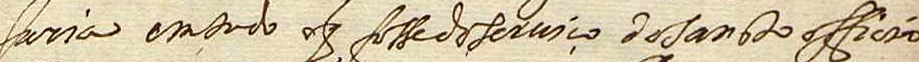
faria em tudo o q̄ fosse do seruiço do sancto officio
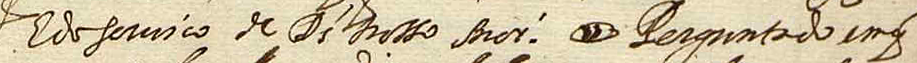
E do seruiço de Ds̄ nosso snor̄. ⁋ Perguntado em q̄
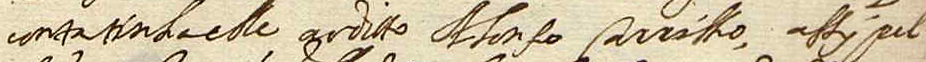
conta tinha elle ao ditto Alonso Carrilho, assy pel
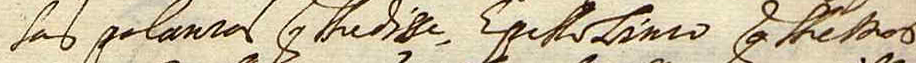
las palauras q̄ lhe disse, e pello Liuro q̄ lhe mos
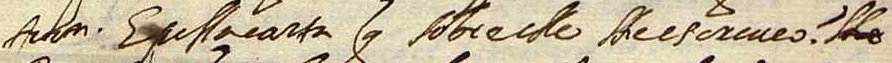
trou. E pella carta q̄ sobre elle lhe escreueo? lle
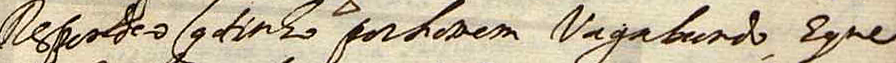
Respondeo q̄ o tinho por homem Vagabundo, E que
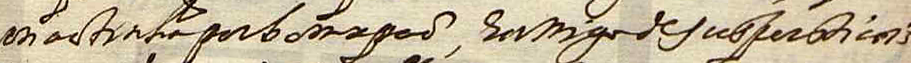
o naõ tinha por bom xpaõ, E amigo de susperstiçois
